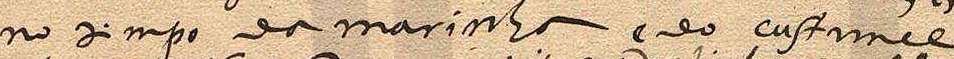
no tempo da marinha e do custume
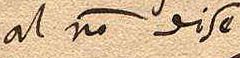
al nō dise
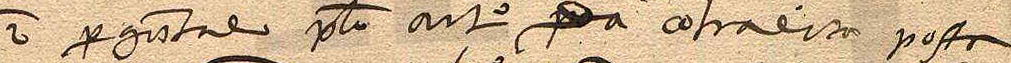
item ꝑgūtado p̄lo arto da cōtradita posta
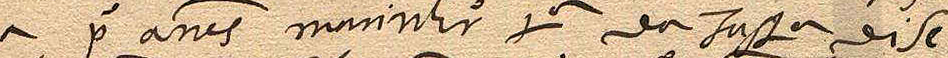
a po an̄es marinhro ta da Justa dise
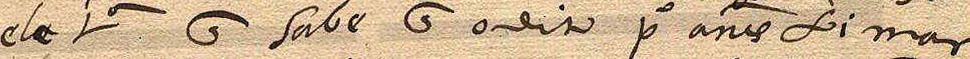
ele ta q̄ sabe q̄ o dito po an̄es foi mar
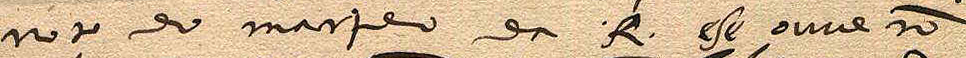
noto do marjdo da .R. e se ouue c̄o
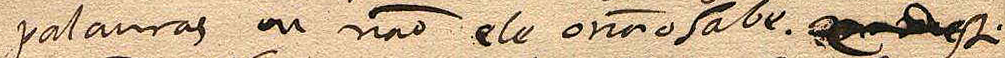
palauras ou não ele o não sabe. _ste
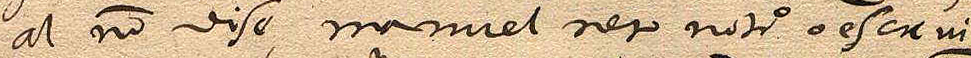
al n̄o dise manuel neto notro o escreui
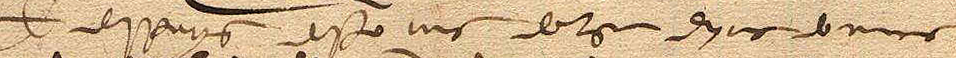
E despoys desto aos doze dyas do mes
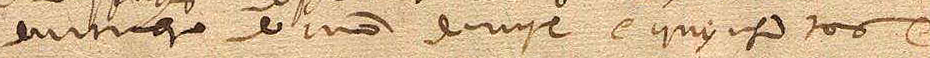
doutubro do anō de mjl e quynhētos e
